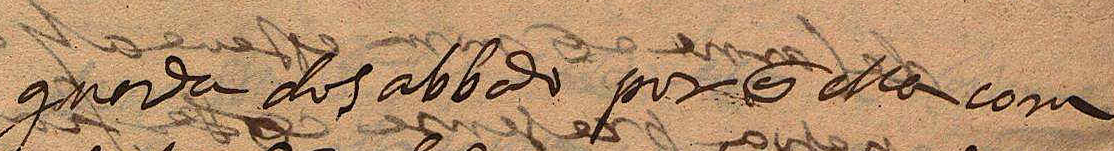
guarda do sabbado porq̄ ella com
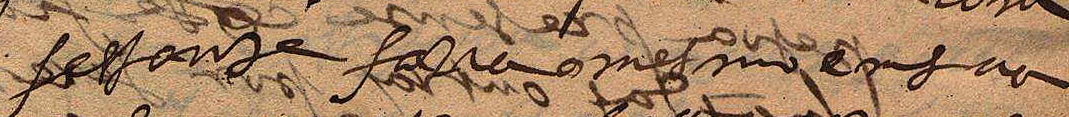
fessante fazia o mesmo em sua
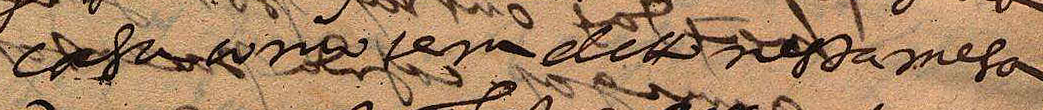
casa como tem ditto nesta mesa
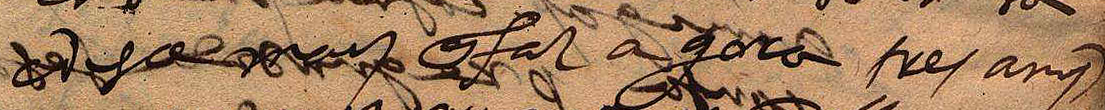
e disse mais q̄ faz agora tres a anos̄
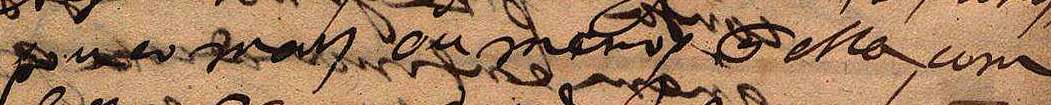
pouco mais ou menos q̄ ella com
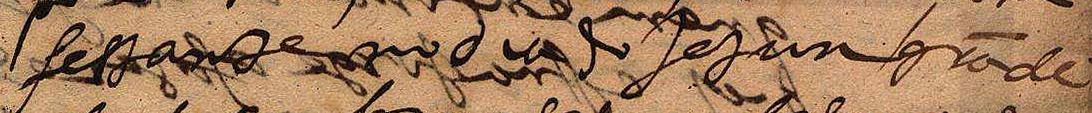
fessante no dia do Jejum grāde
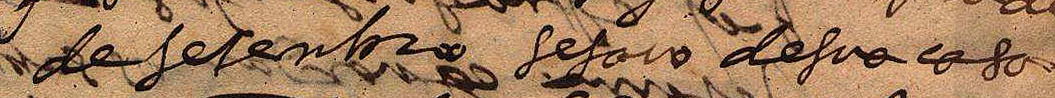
de setenbro se saio de sua casa
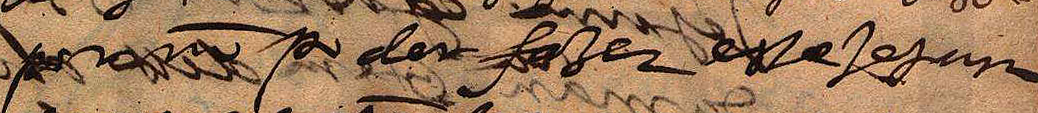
por nō poder fazer este Jejum
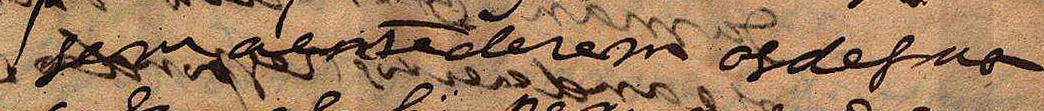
sem a entēderem os de sua
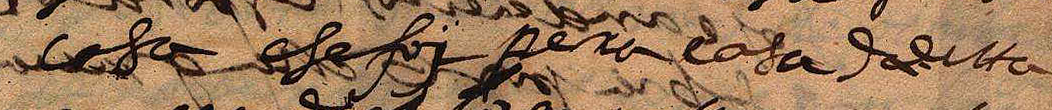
casa e se foj pera casa da ditta
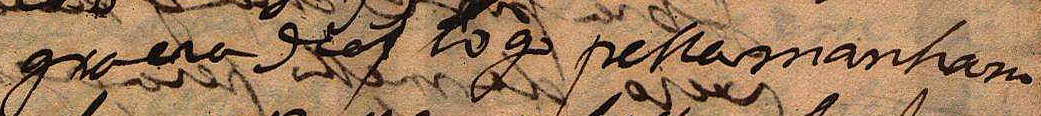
gracia dias logo pella manham
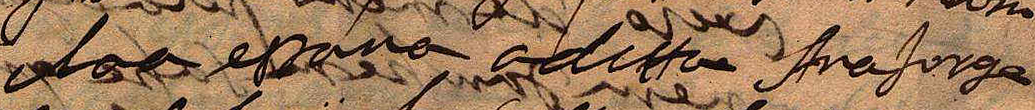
e laa estaua a ditta Ana Jorge
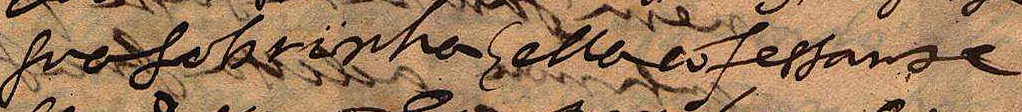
sua sobrinha E ella cōfessante
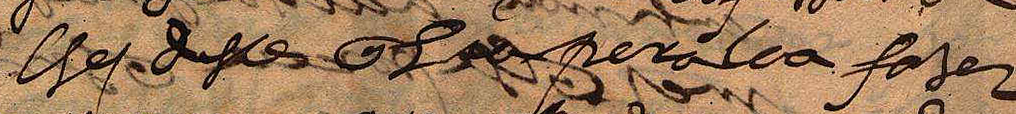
lhes disse q̄ Era pera laa fazer
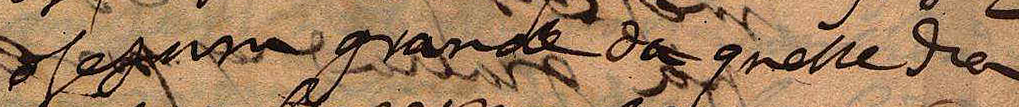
o jejum grande daquelle dia
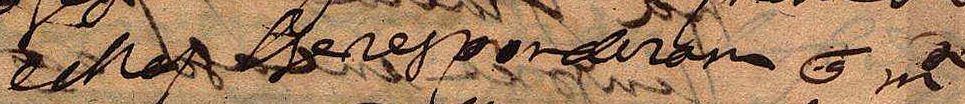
e ellas lhe responderam q̄ mto
